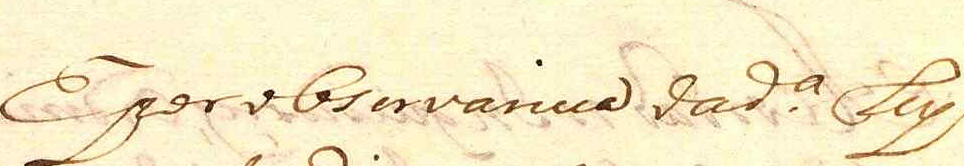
E por observancia da d.a Ley
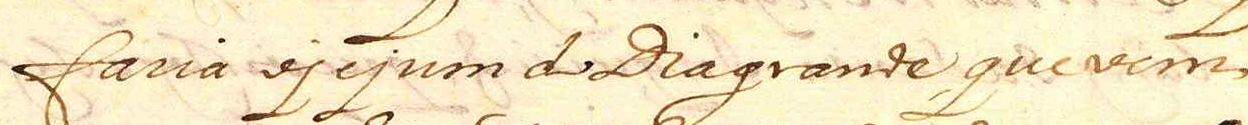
fazia o jejum do Dia grande, que vem
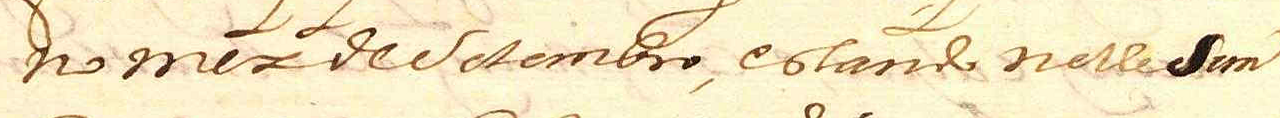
no mez de setembro, estando nelle sem
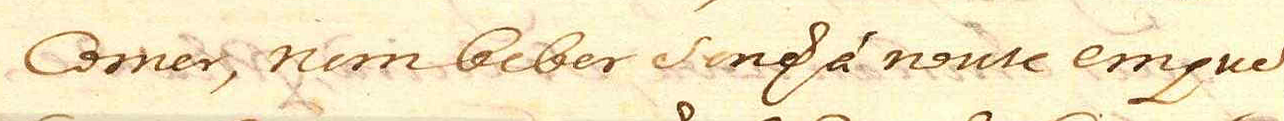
Comer, nem beber senaõ á noute em que
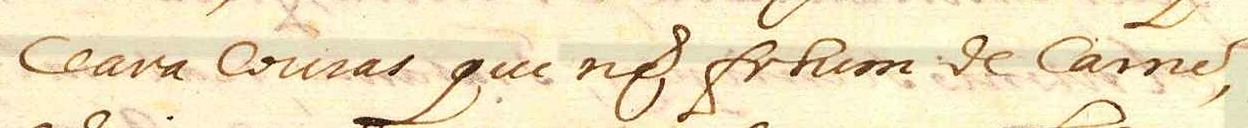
Ceava couzas que naõ fosem de carne,
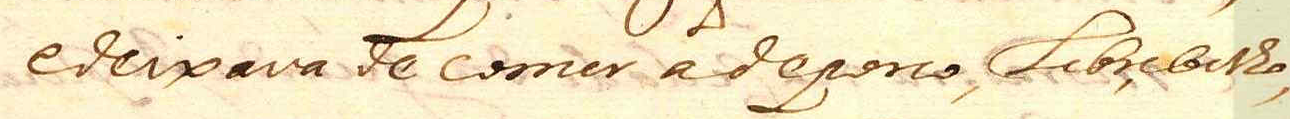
e deixava de comer a de porco, Lebre, Coelho,
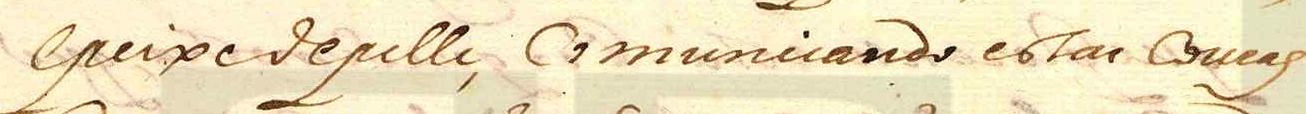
e peixe de pelle, comunicando estas couzas
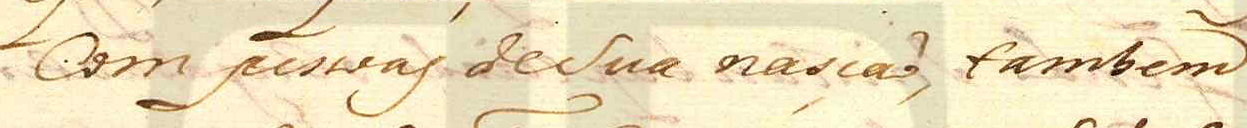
Com pessoas de sua nasçaõ, tambem
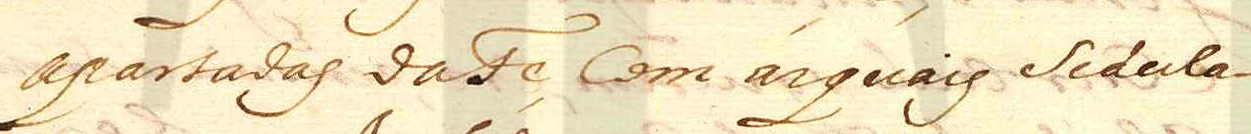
apartadas da Fe, com as quais se decla
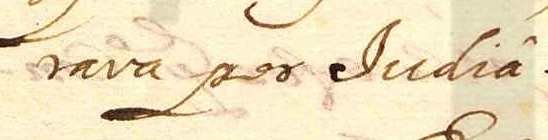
rava por Iudia.
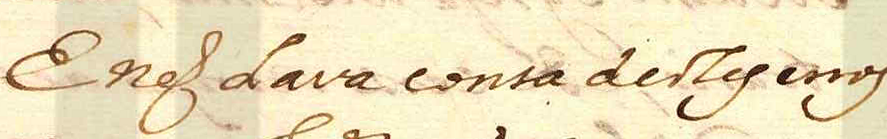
E naõ dava conta destes erros
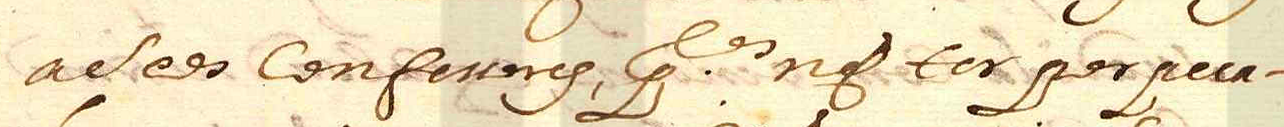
a seos confessores, p.los naõ ter por peca
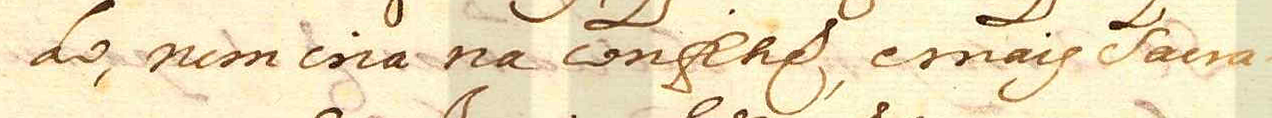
do, nem cria na confissaõ, e mais sacra
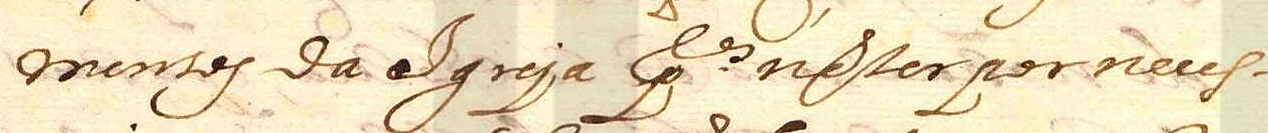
mentos da Igreja p.los naõ ter por neces
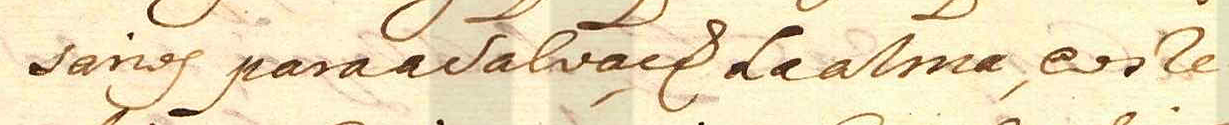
sarios para a salvaçaõ da alma, e os Re
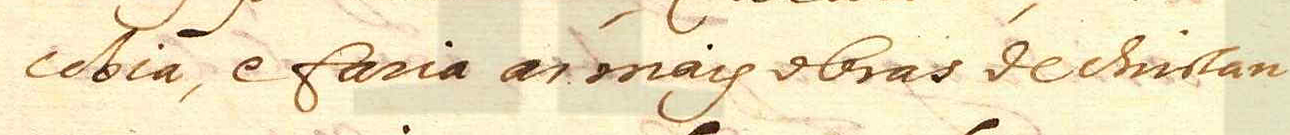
cebia, e fazia as mais obras de christan
